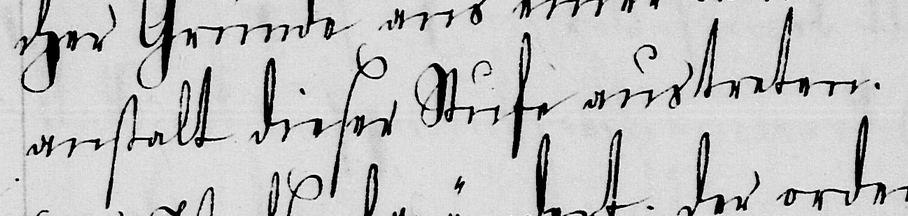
anstalt dieser Stufe austreten.
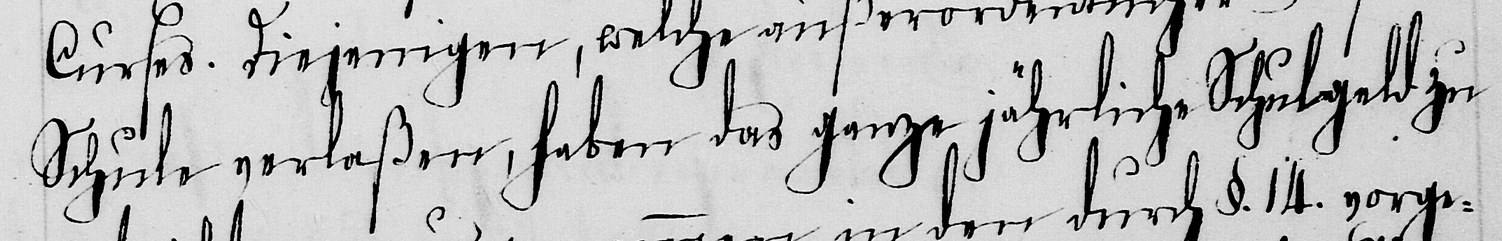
Schule verlaßen, haben das ganze jährliche Schulgeld zu
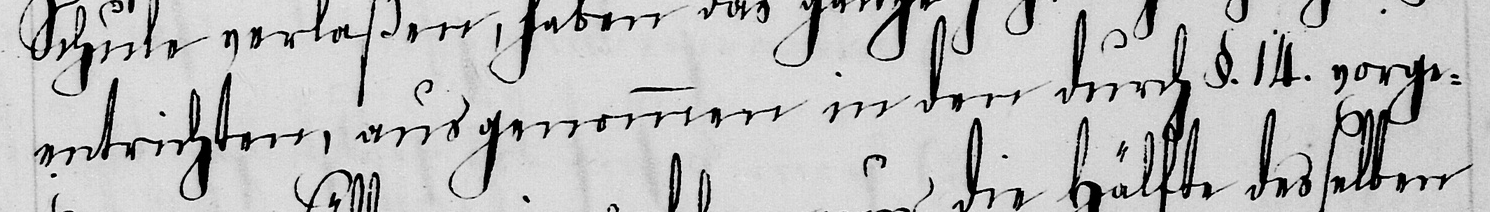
entrichten, ausgenommen in den durch §. 14. vorge¬
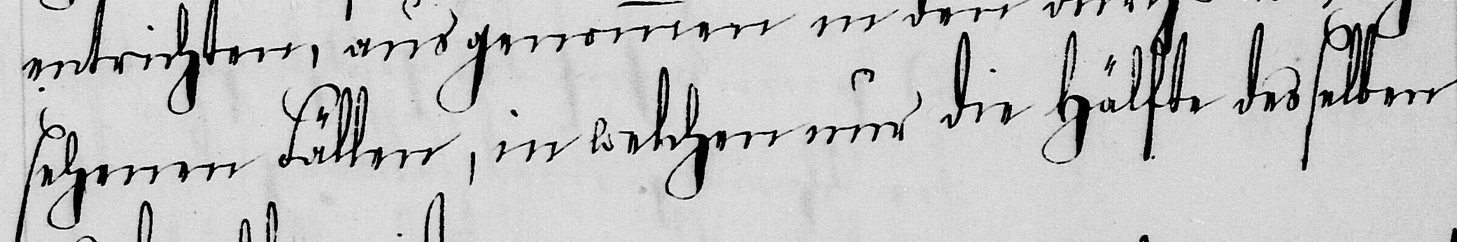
sehenen Fällen, in welchen nur die Hälfte desselben
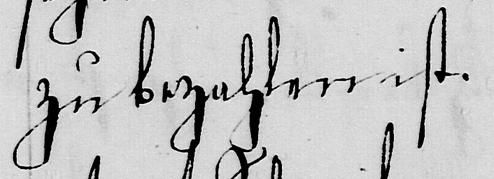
zu bezahlen ist.
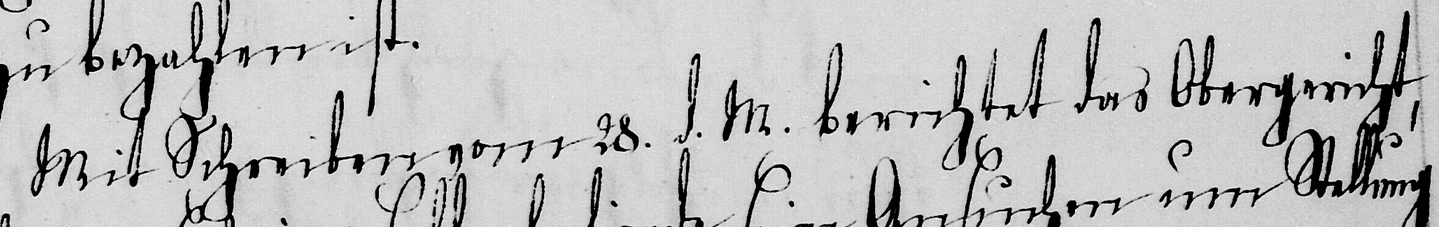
Mit Schreiben vom 28. d. M. berichtet das Obergericht,
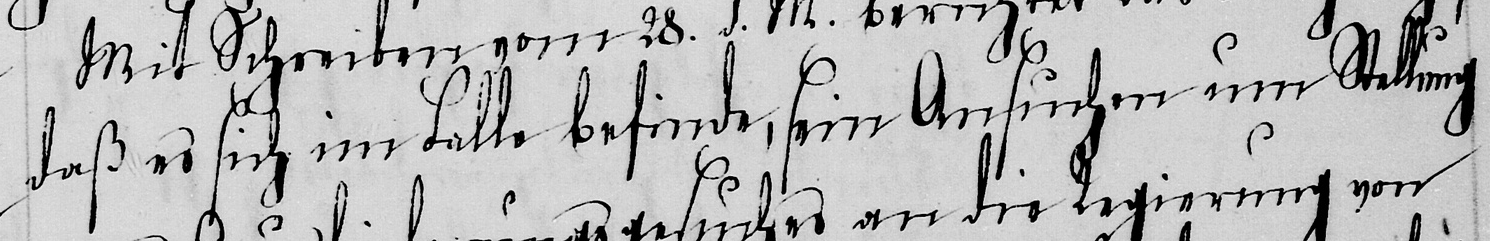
daß es sich im Falle befinde, sein Ansuchen um Stellung
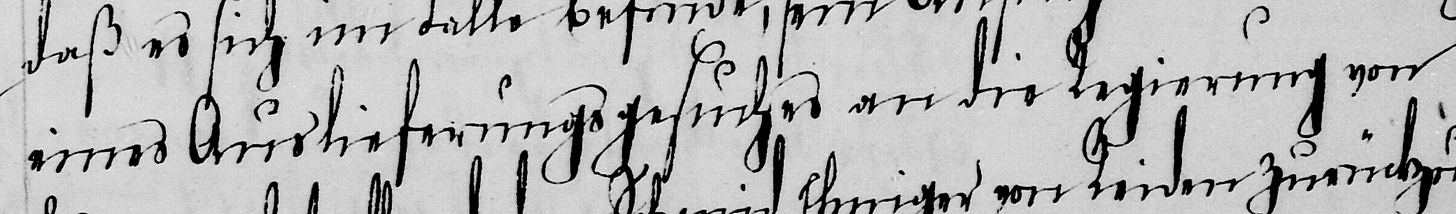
eines Auslieferungsgesuches an die Regierung von
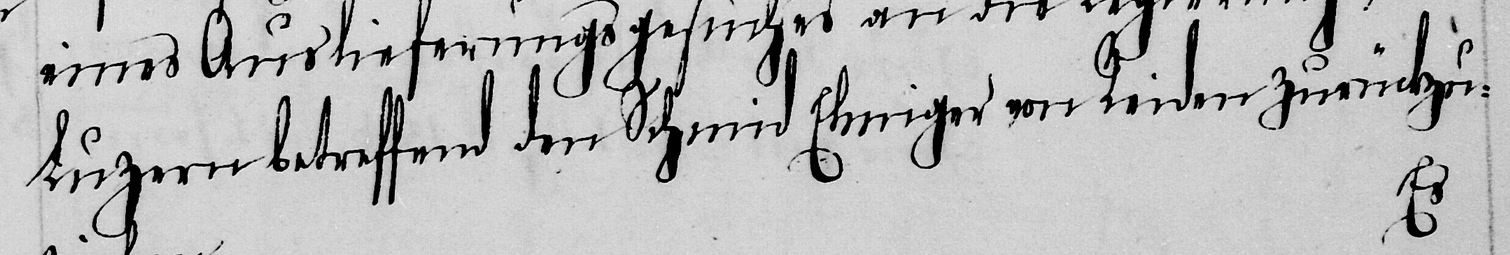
Luzern betreffend den Schmid Elmiger von Reiden zurückzu¬
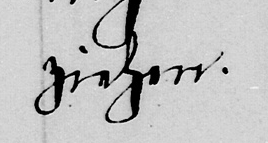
ziehen.
